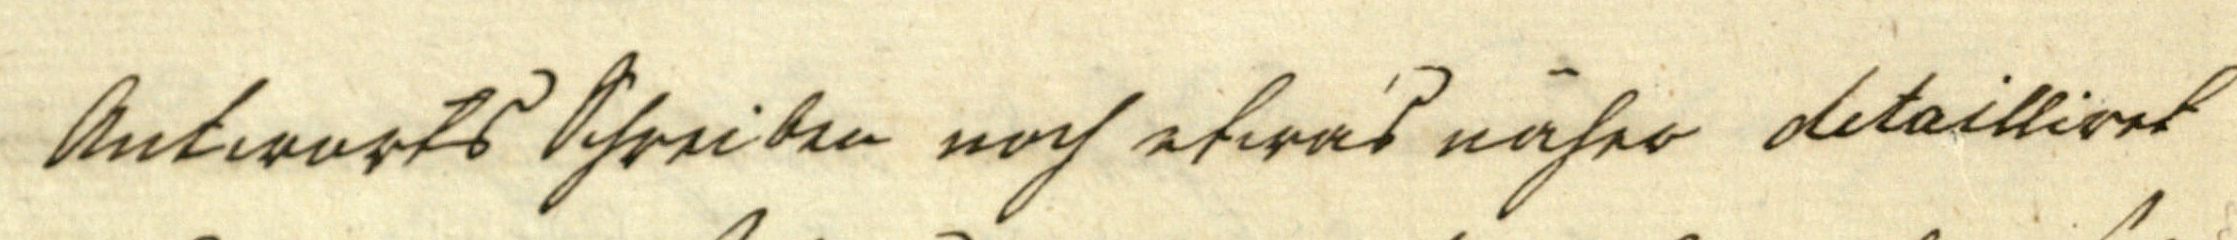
Antworts Schreiben noch etwas näher detailliret
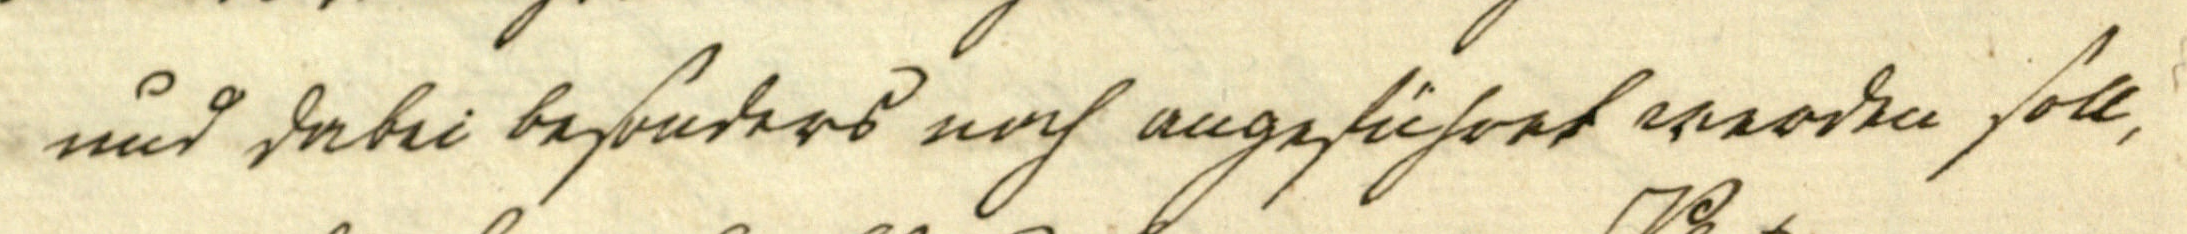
und dabei besonders noch angeführet werden soll,
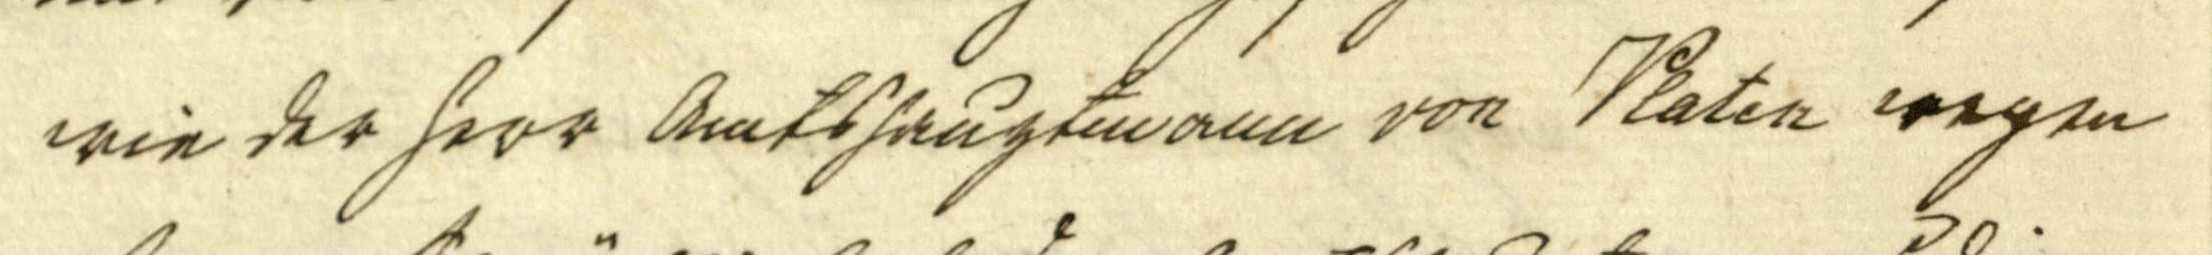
wie der Herr Amtshauptmann von Platen wegen
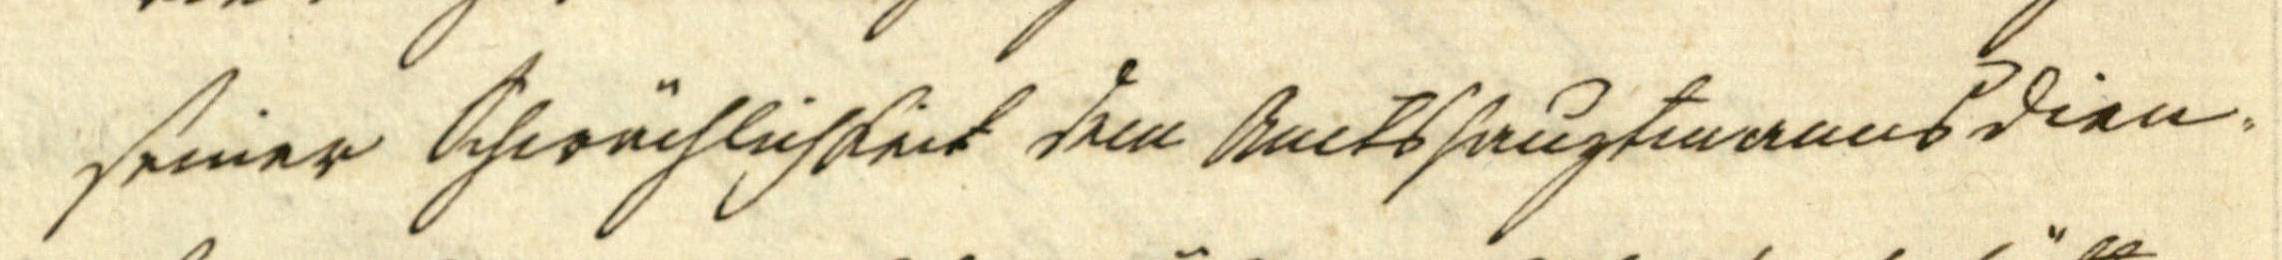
seiner Schwächlichkeit dem Amtshauptmanns dien¬
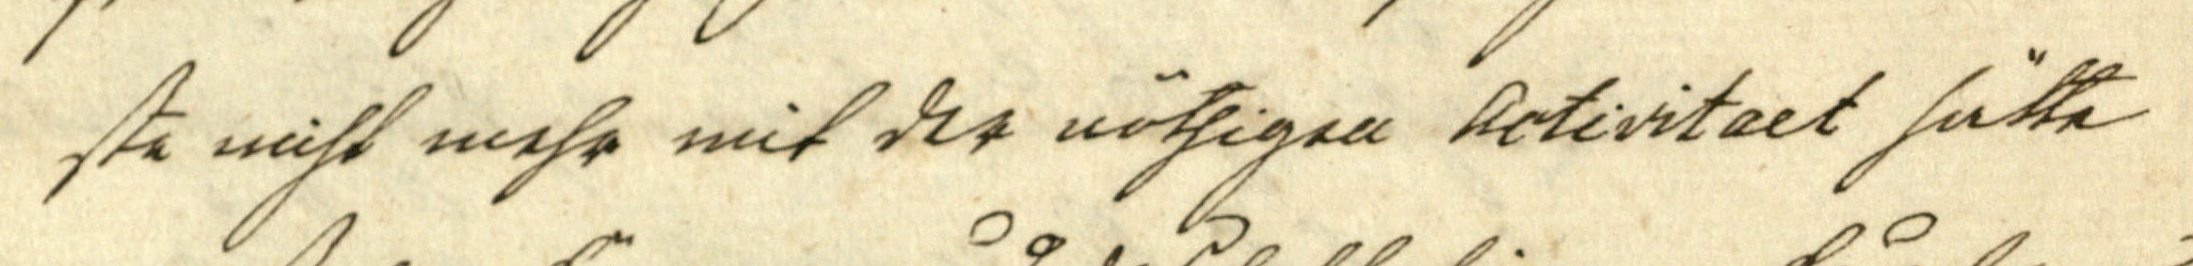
ste nicht mehr mit der nöthigen Activitaet hätte
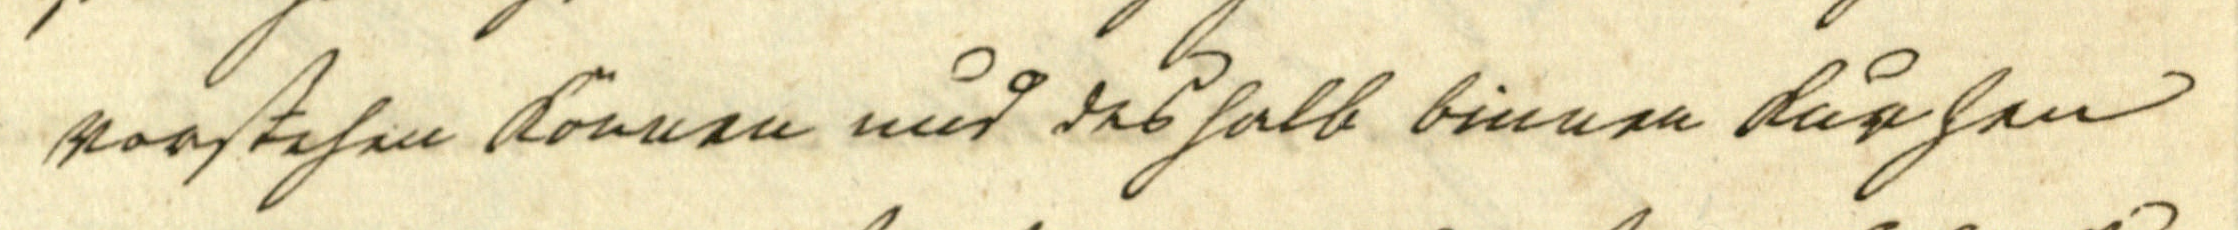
vorstehen können und des halb binnen kurzen
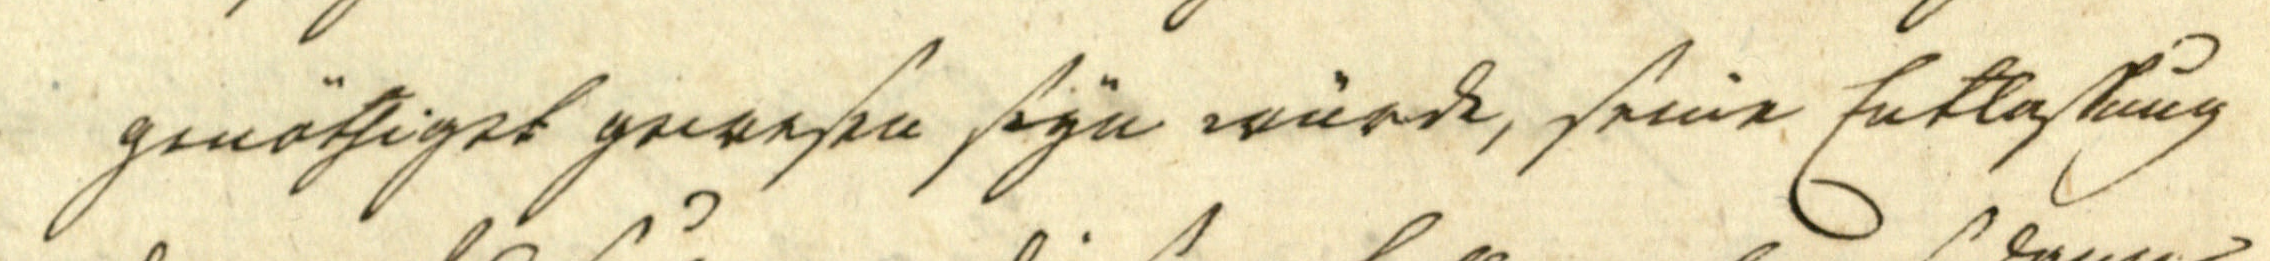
genöthiget gewesen seÿn würde, seine Entlassung
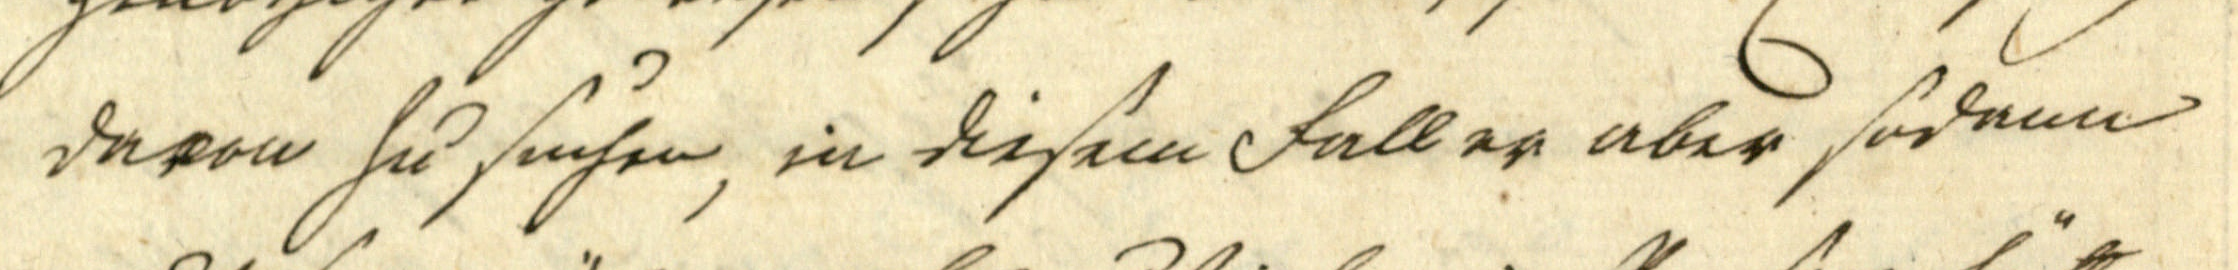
davon zu suchen, in diesem Fall er aber sodann
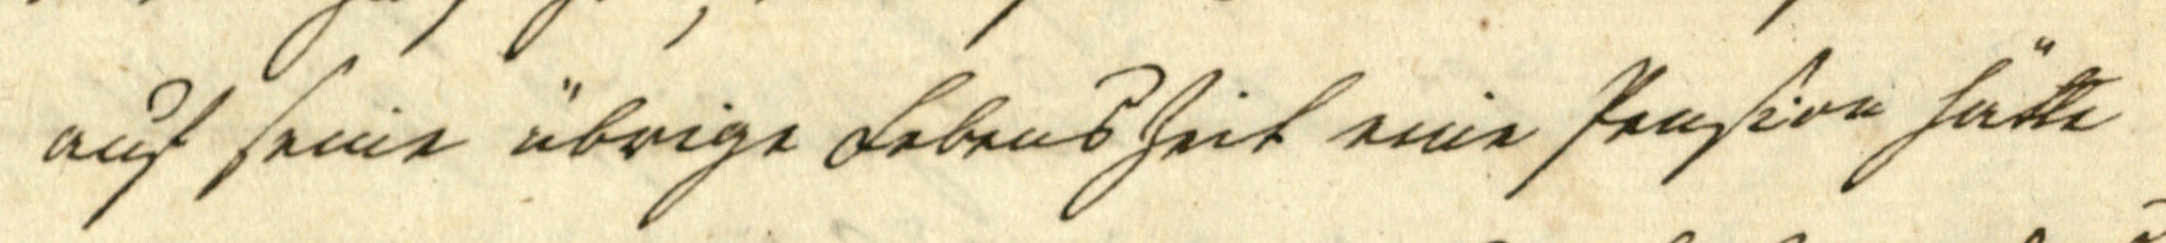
auf seine übrige Lebenszeit eine Pension hätte
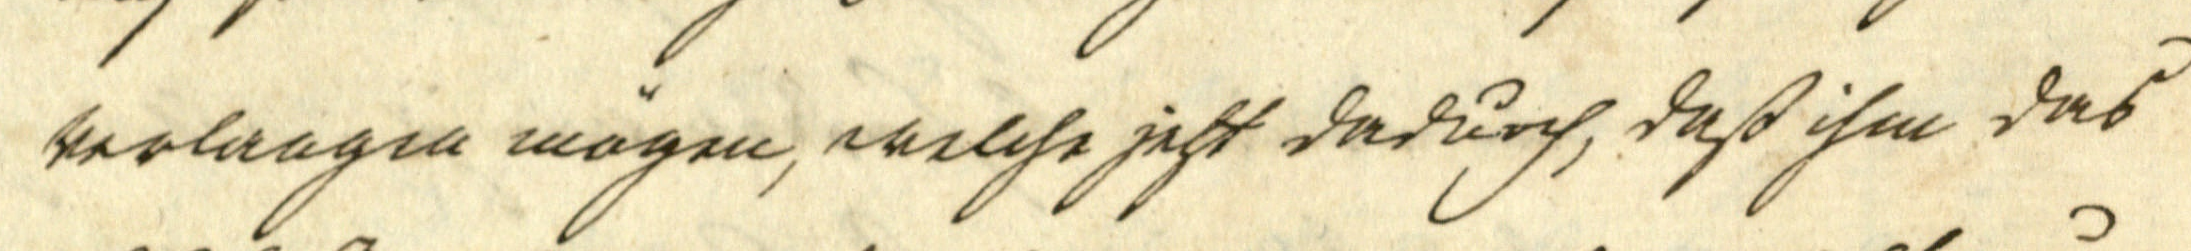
verlangen mögen, welche jetzt dadurch, daß ihm das
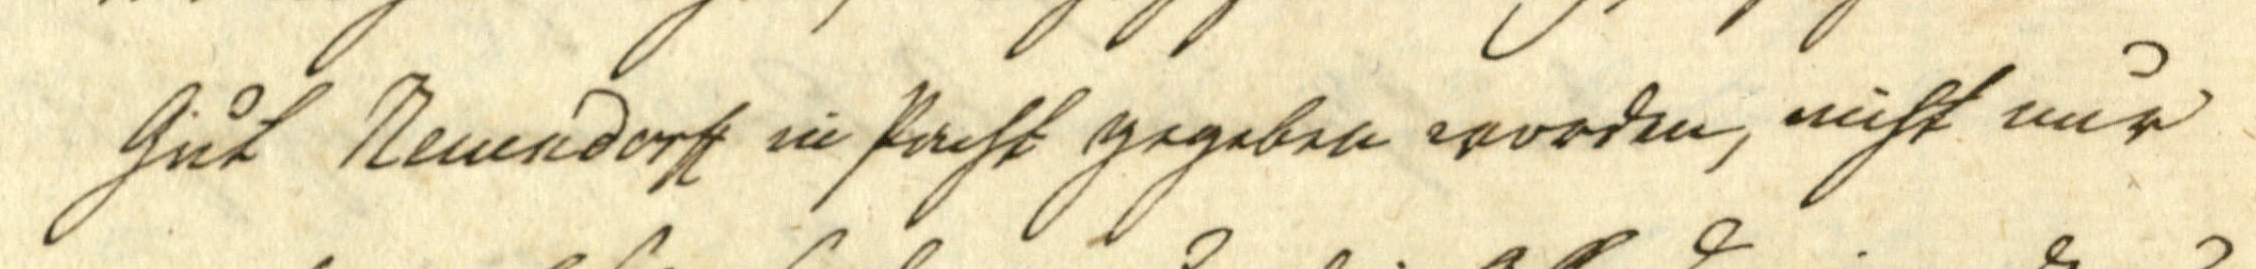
Gut Neuendorff in Pacht gegeben worden, nicht nur
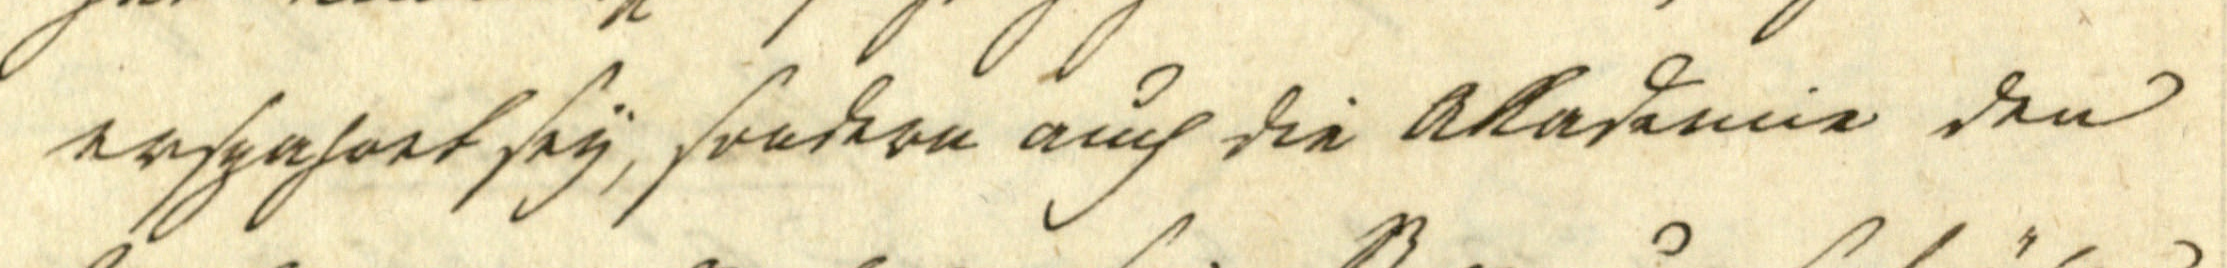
erspahret seÿ, sondern auch die Akademie den
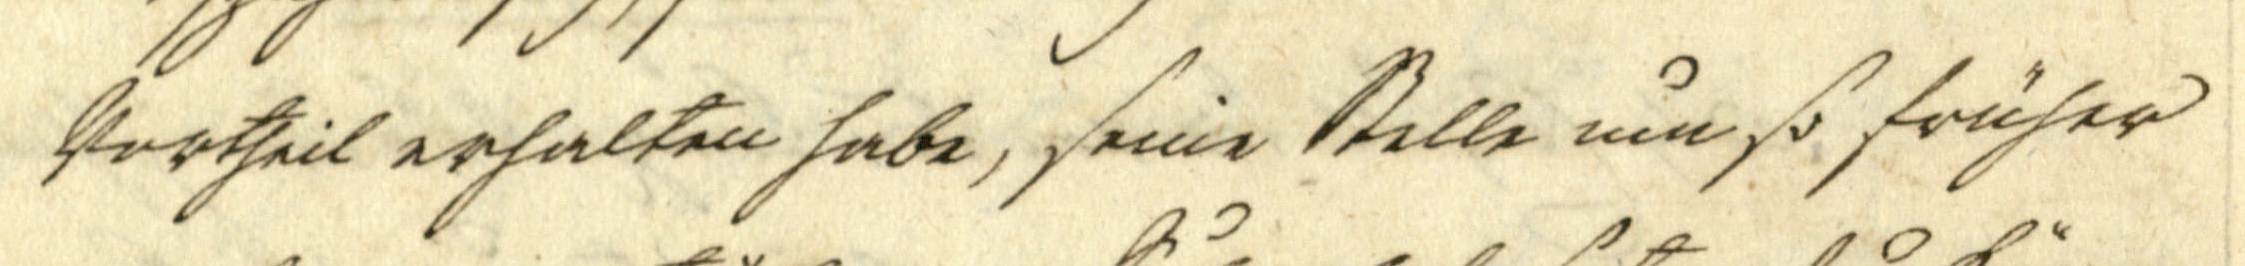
Vortheil erhalten habe, seine Stelle um so früher
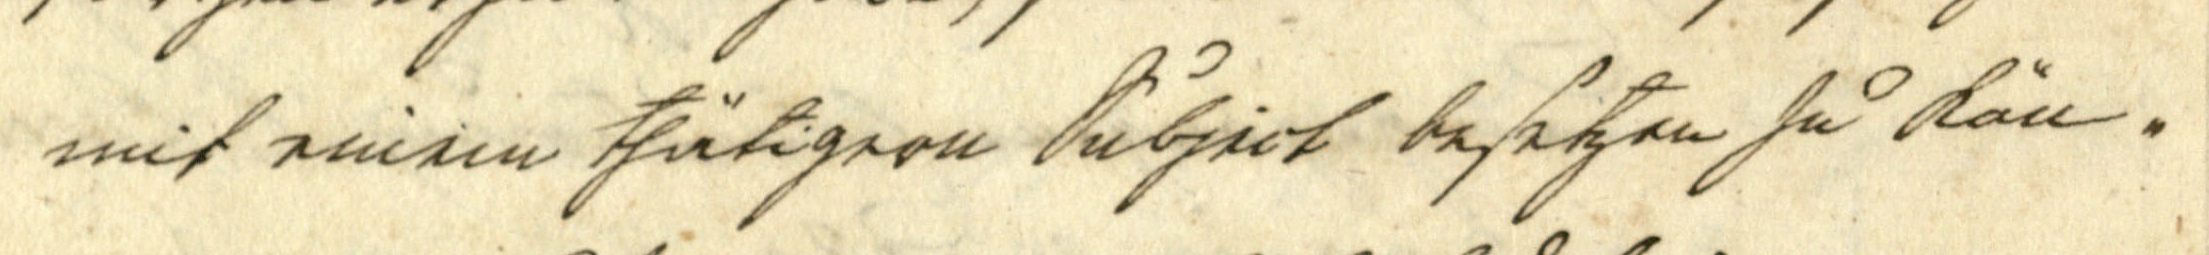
mit einem thätigen Subject besetzen zu kön¬
